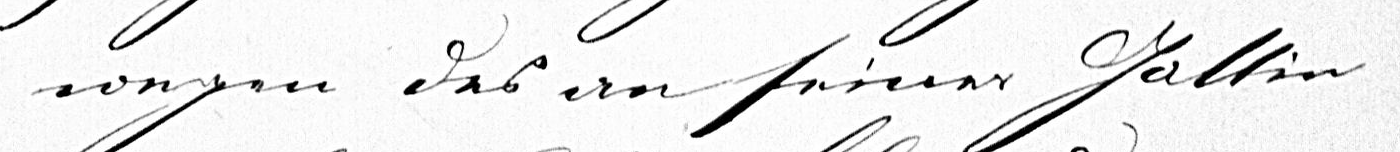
wegen des an seiner Gattin
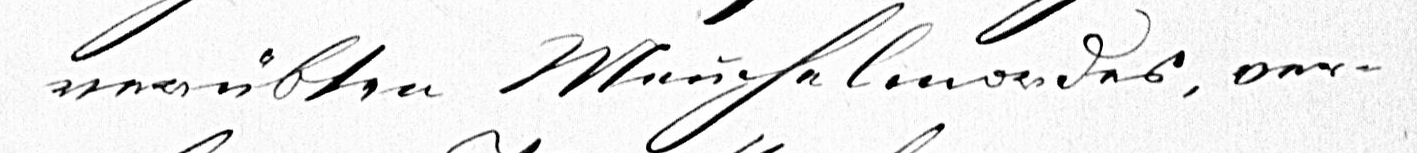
verübten Meuchelmordes, ver¬
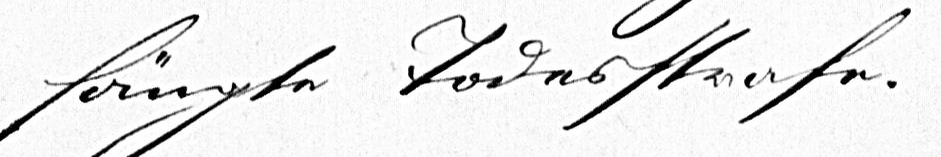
hängte Todesstrafe.
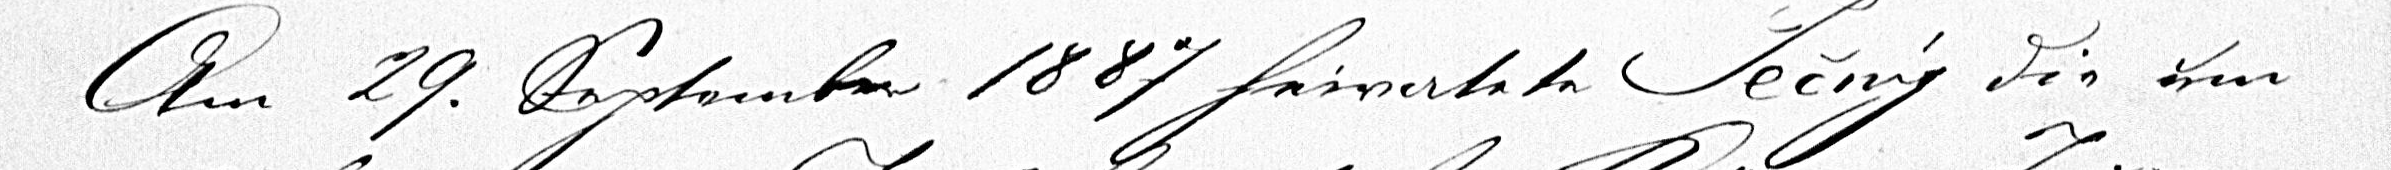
Am 29. September 1887 heiratete Jecny die um
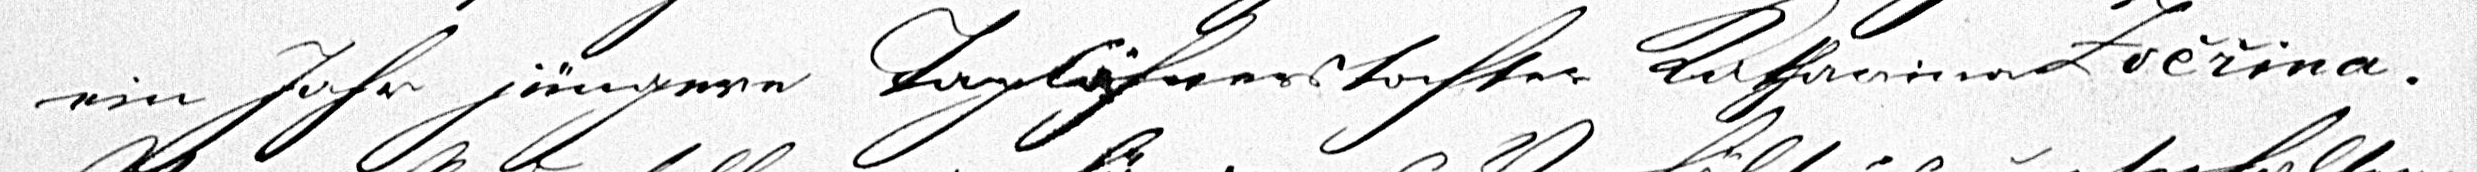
ein Jahr jüngere Taglöhnerstochter Katharina Zoerina.
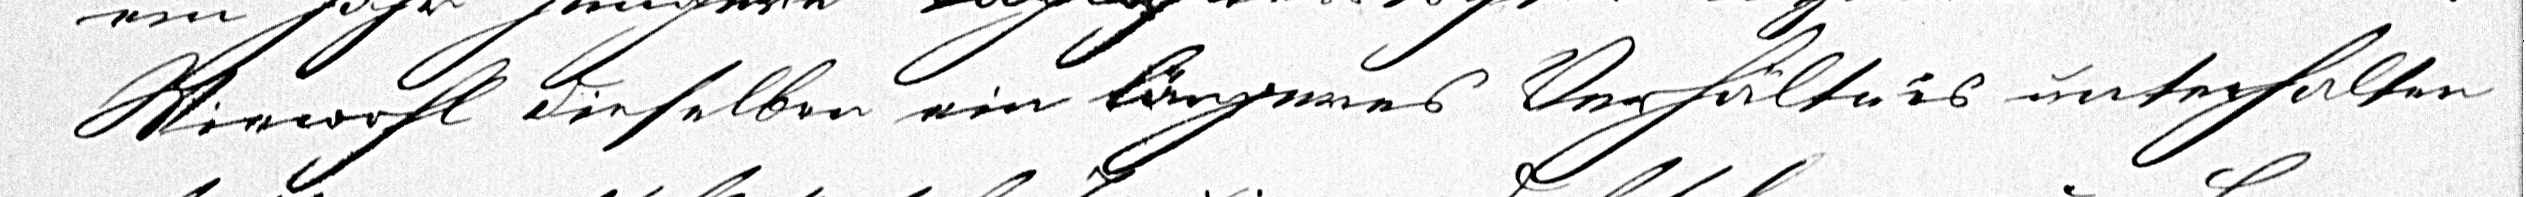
Wiewohl dieselben ein längeres Verhälters unterhalten
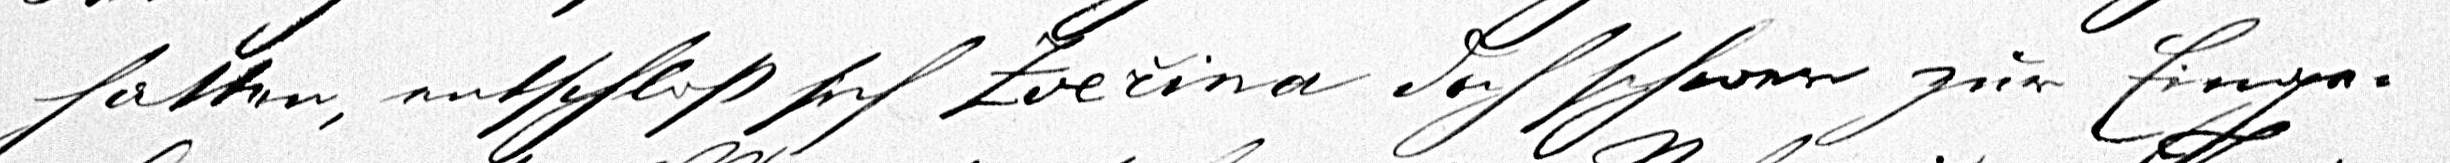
hatten, entschloß sich Zverina doch schwere zur Einge¬
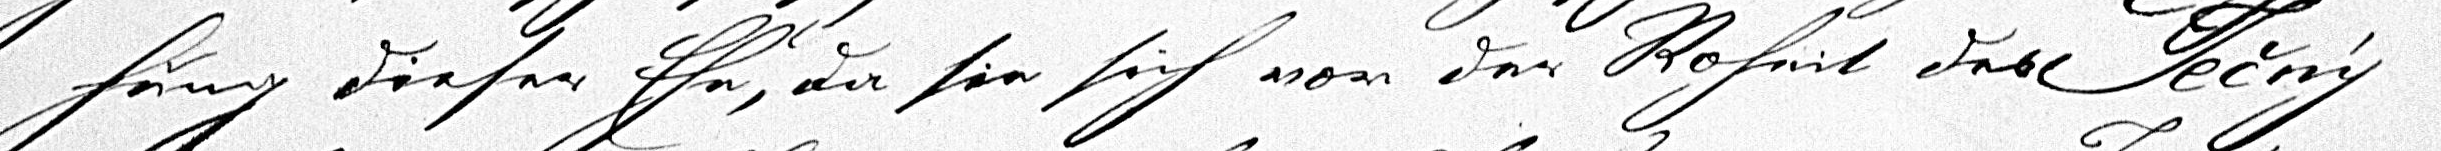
hung dieser Ehr, da sie sich von der Roheit des Jecný
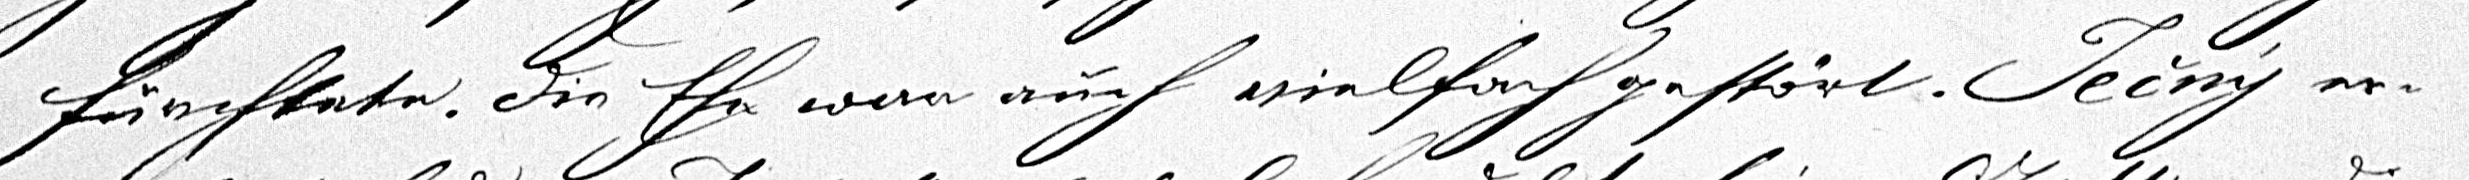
fürchtete. Die Ehr war auch vielfach gestörl. Jecný er¬
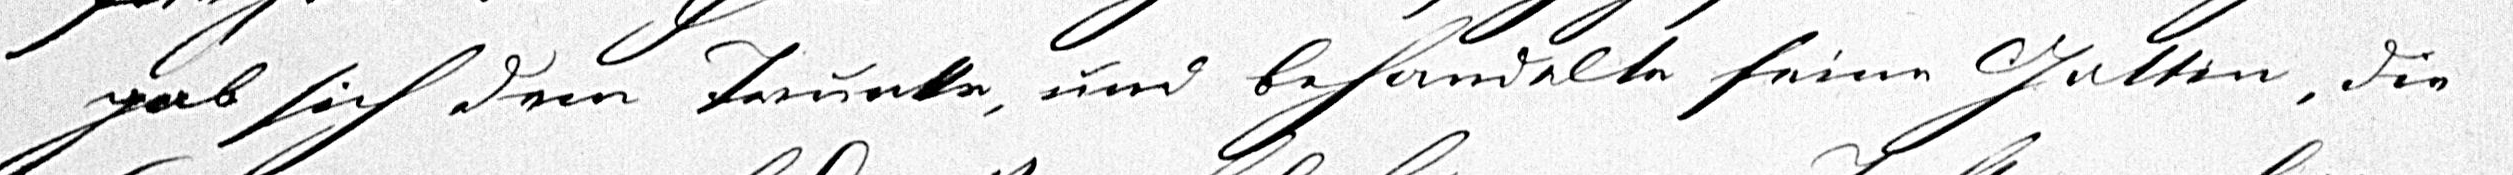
gab sich dem Trunke, und behandelte seine Gattin, die
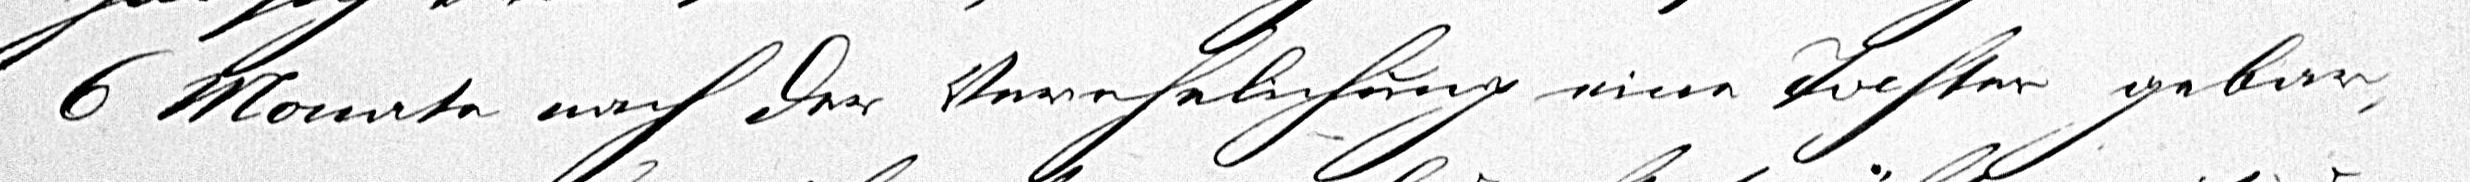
6 Monate nach der Verehelichung eine Tochter gebar,
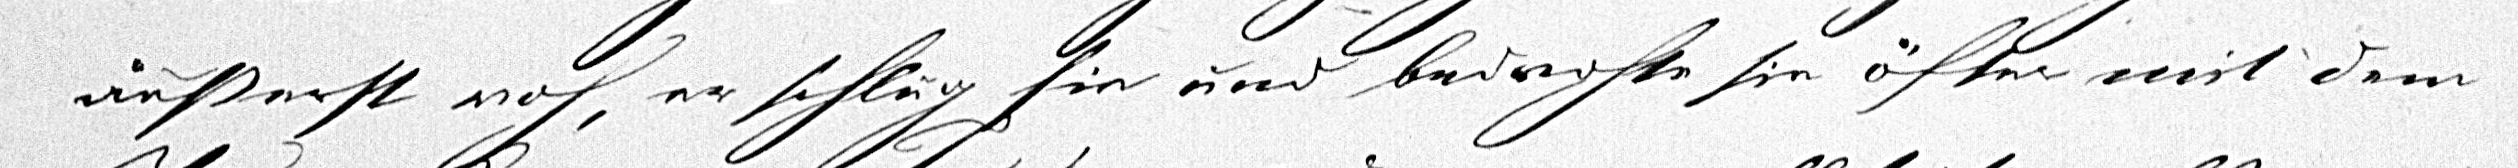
außerst noch, er schlüg sie und bedrohte sie öfter mit dem
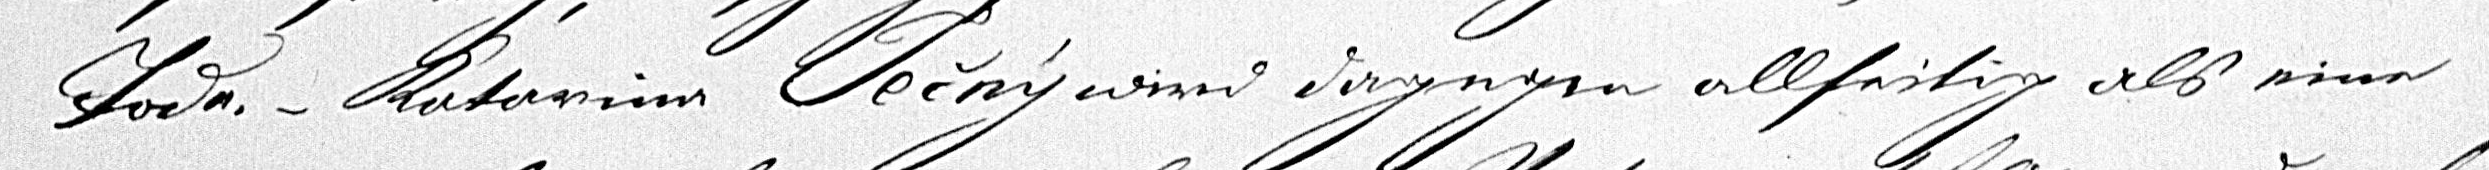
Tode. - Katarina Jecný wrid dagegen allseitig als eine
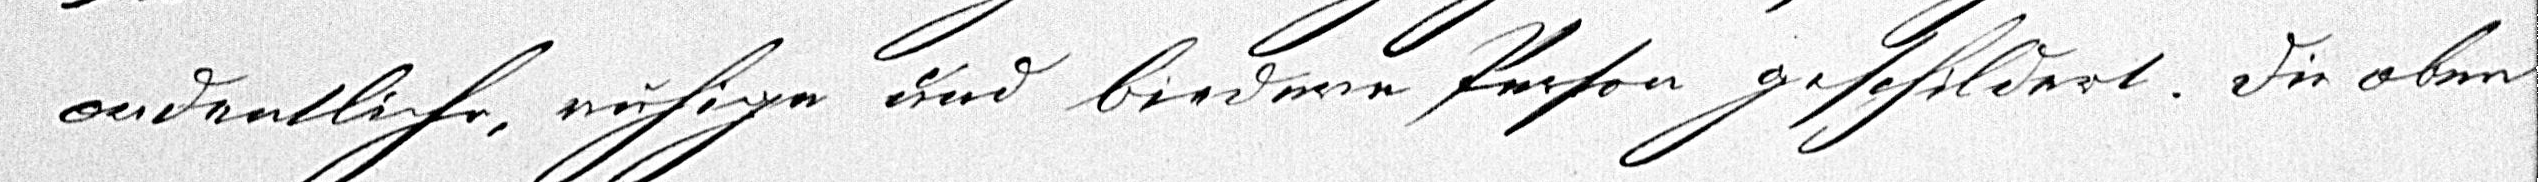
ordentliche, ruhige und biedere Person geschildert. Die oben
